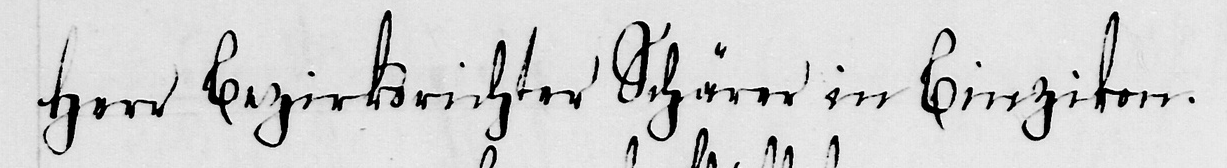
Herr Bezirksrichter Schärer in Binzikon.
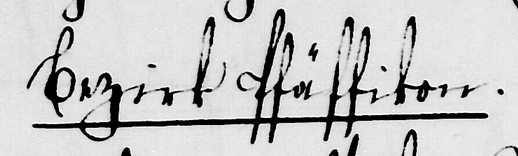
Bezirk Pfäffikon.
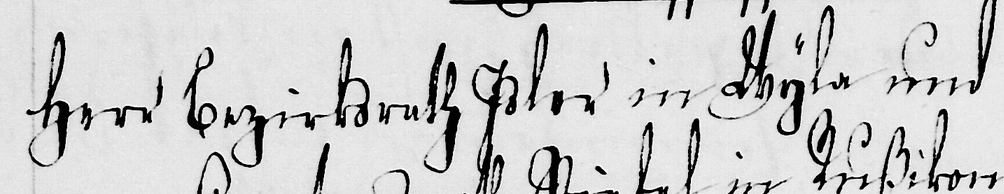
Herr Bezirksrath Isler in Wyla und
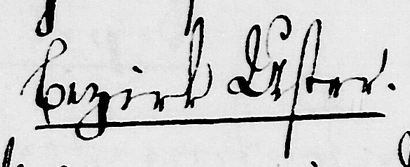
Bezirk Uster.
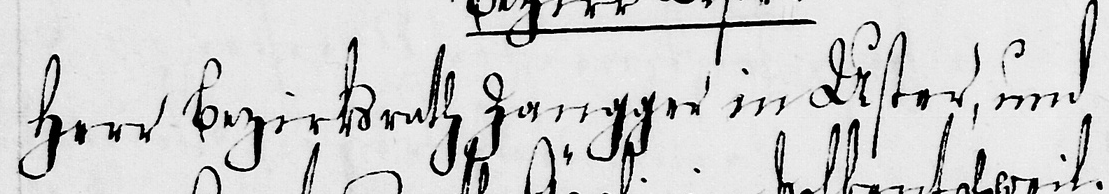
Herr Bezirksrath Zangger in Uster, und
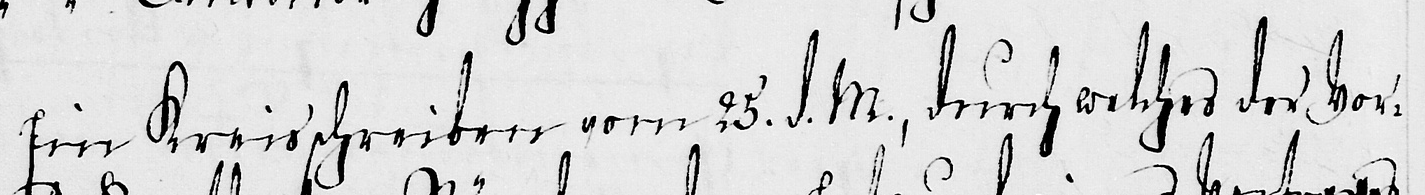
Ein Kreisschreiben vom 25. d. M., durch welches der Vor¬
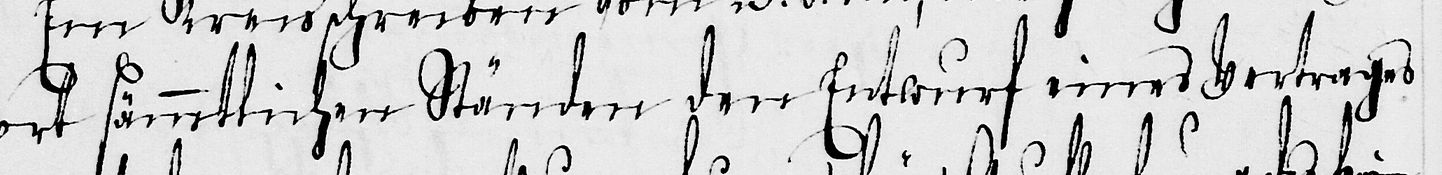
ort sämmtlichen Ständen den Entwurf eines Vertrages
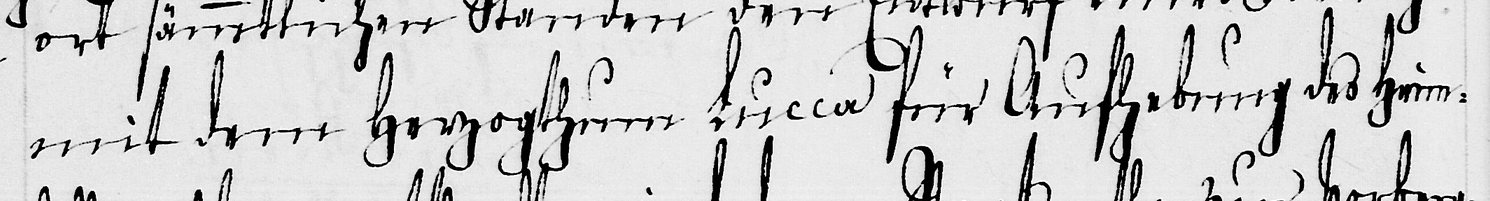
mit dem Herzogthum Lucca für Aufhebung des Heim¬
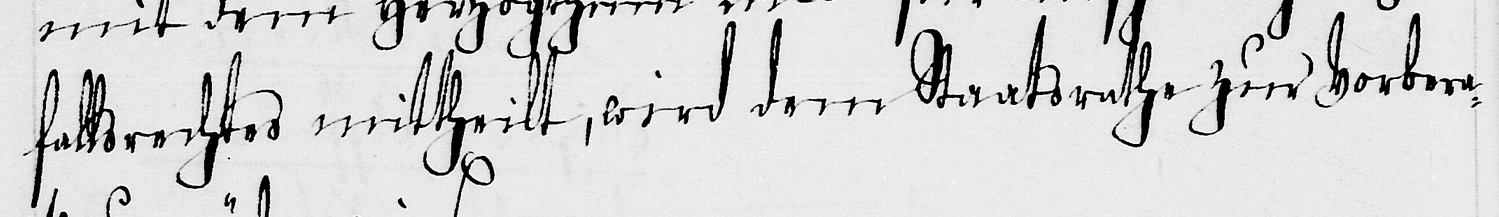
fallsrechtes mittheilt, wird dem Staatsrathe zur Vorbera¬
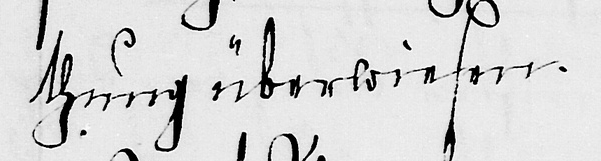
thung überwiesen.
